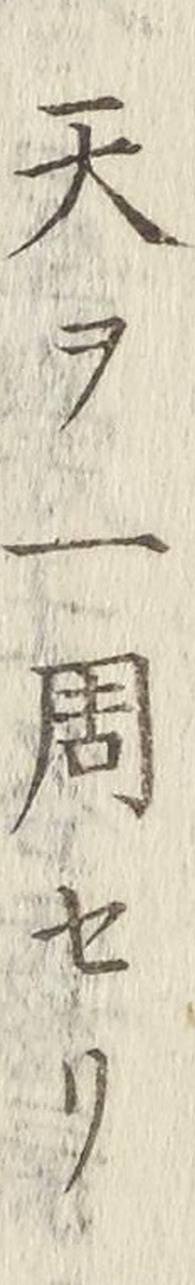天ヲ一周セリ
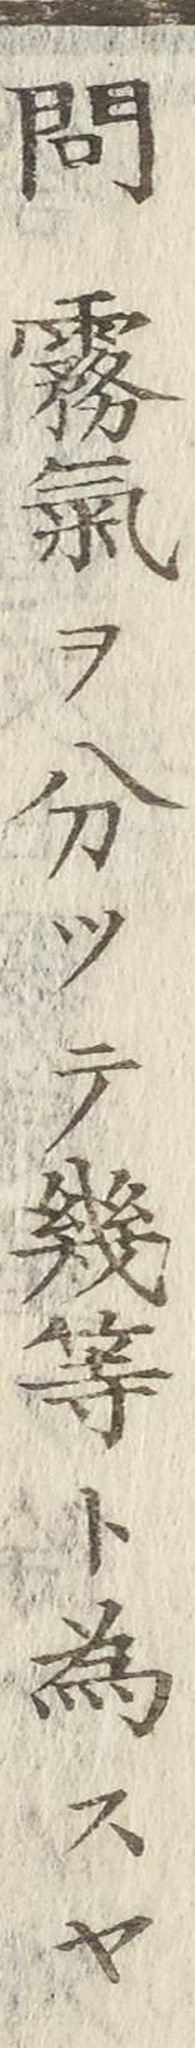問霧気ヲ分ツテ幾等ト為スヤ
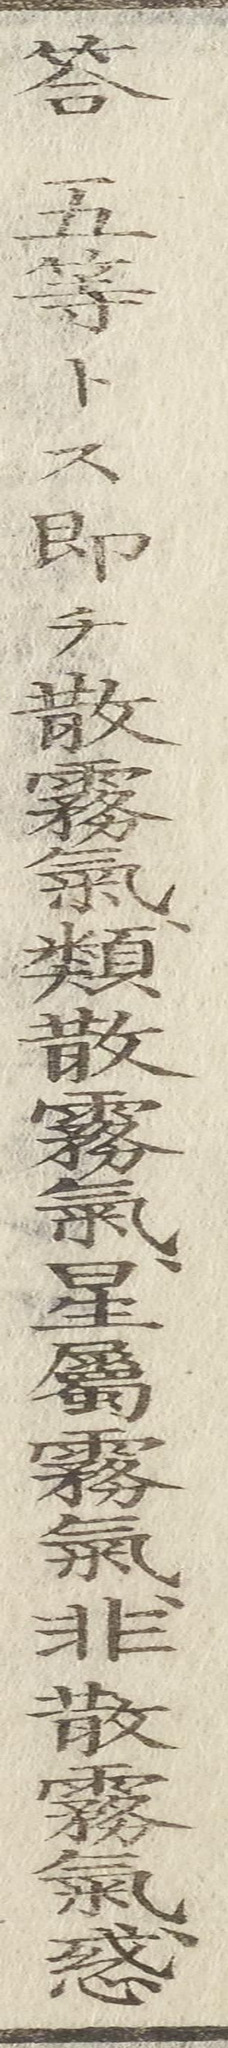答五等トス即チ散霧気類、類散霧気、星属霧気、非散霧気、惑
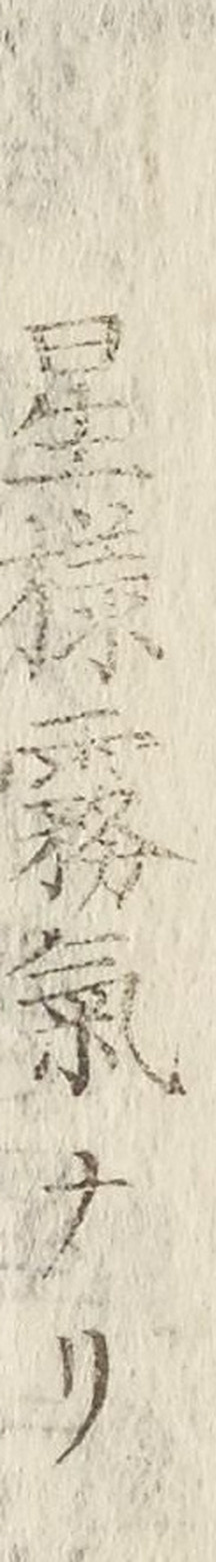星様霧気ナリ
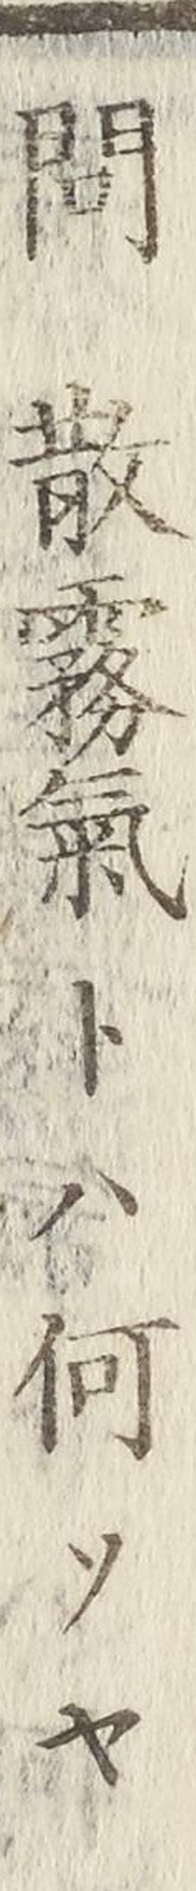問散霧気トハ何ソヤ
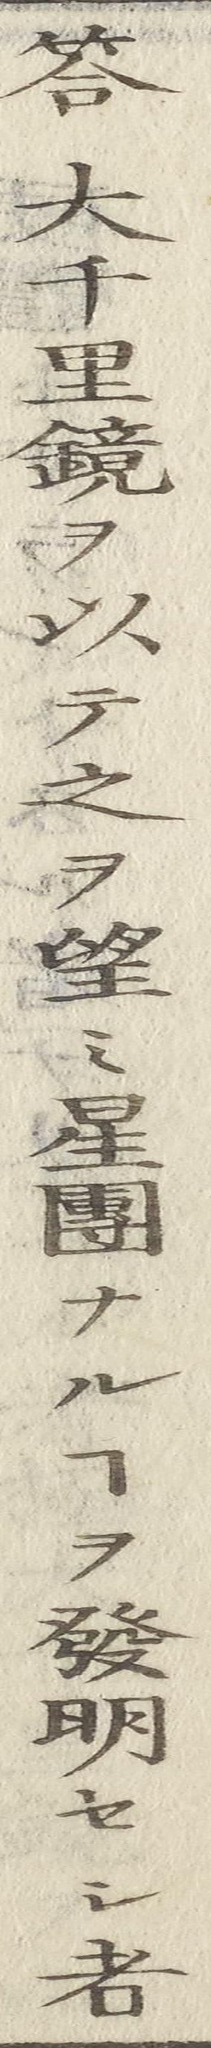答大千里鏡ヲ以テ之ヲ望ミ星団ナルコトヲ発明セシ者
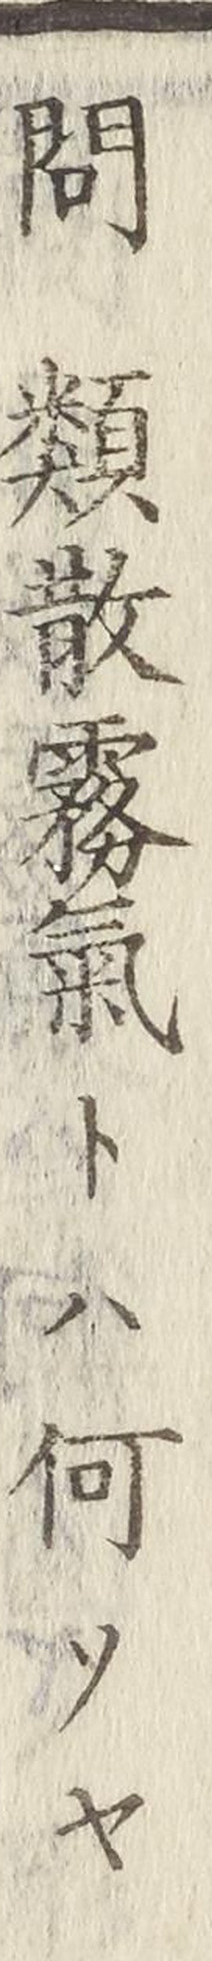問類散霧気トハ何ソヤ
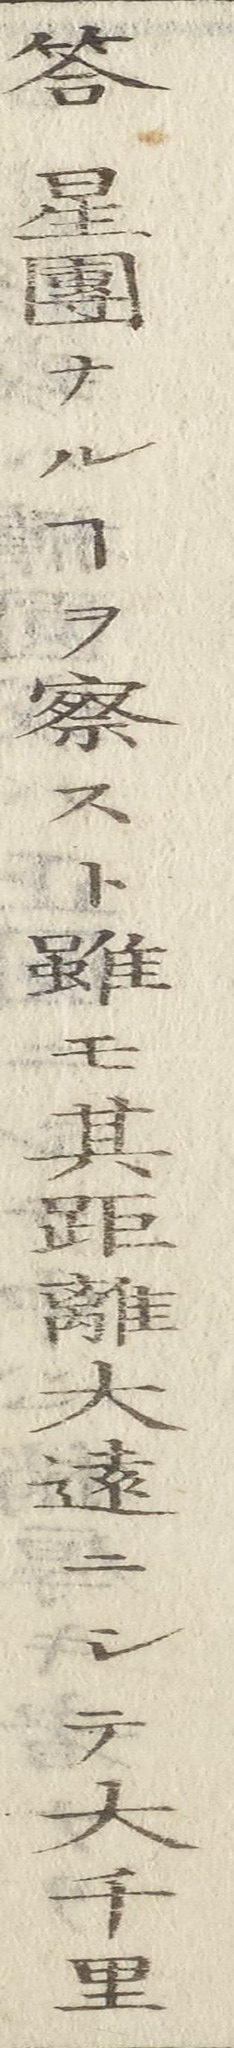答星団ナルコトヲ察スト雖モ其距離大遠ニシテ大千里
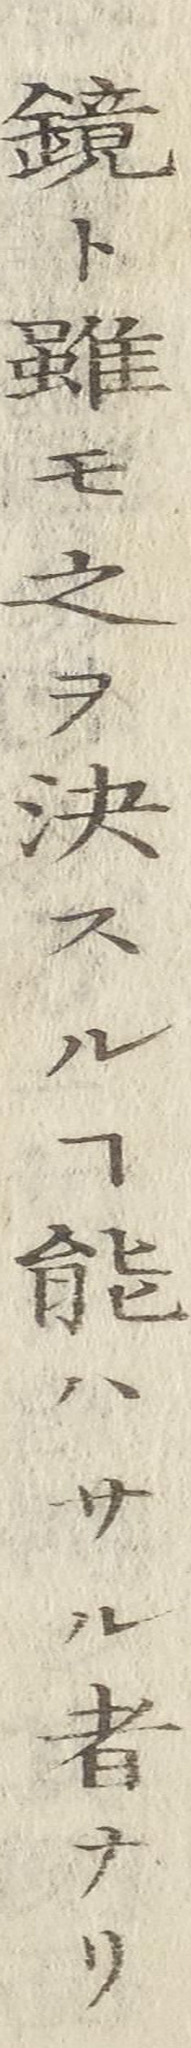鏡ト雖モ之ヲ決スルコト能ハサル者ナリ

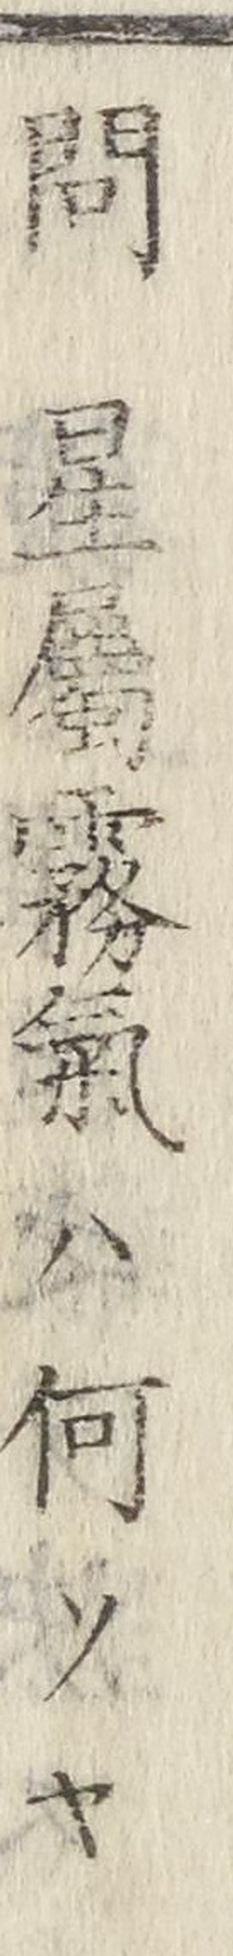問星属霧気ハ何ソヤ
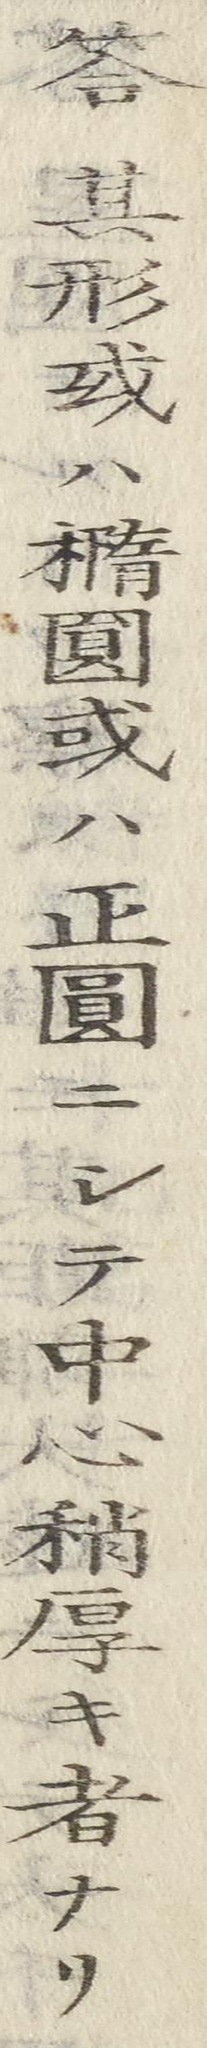答其形或ハ楕円或ハ正円ニシテ中心稍厚キ者ナリ
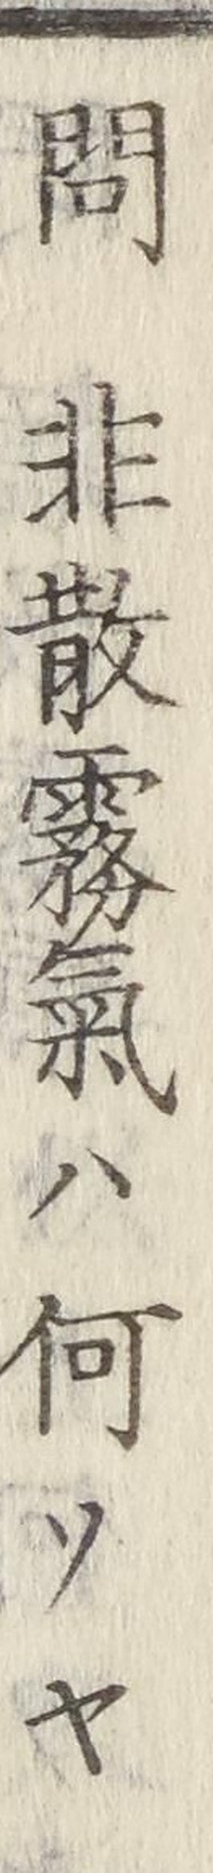問非散霧気ハ何ソヤ
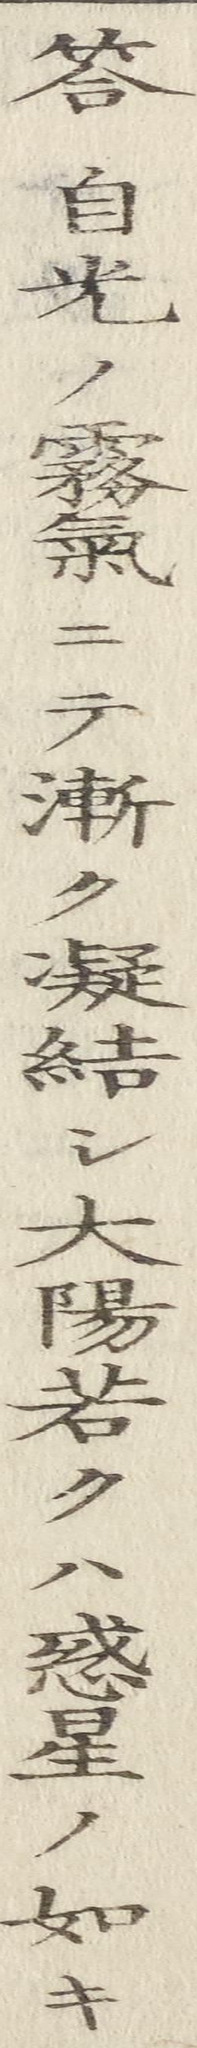答自光ノ霧気ニテ漸ク凝結シ大陽若クハ惑星ノ如キ
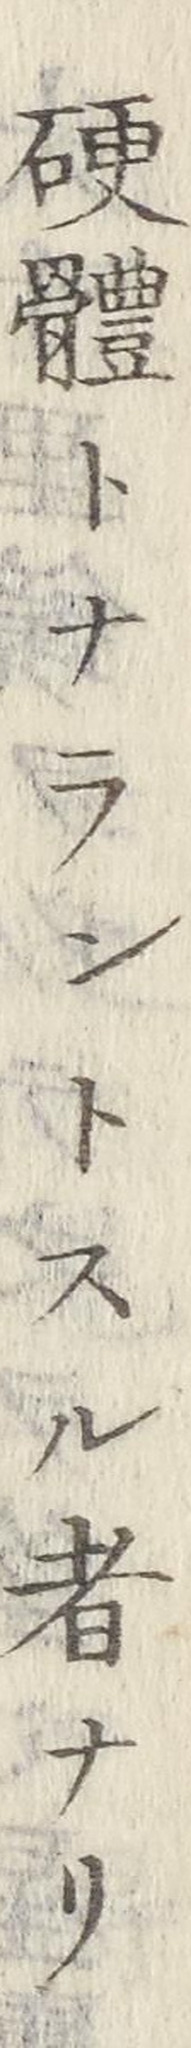硬体トナラントスル者ナリ
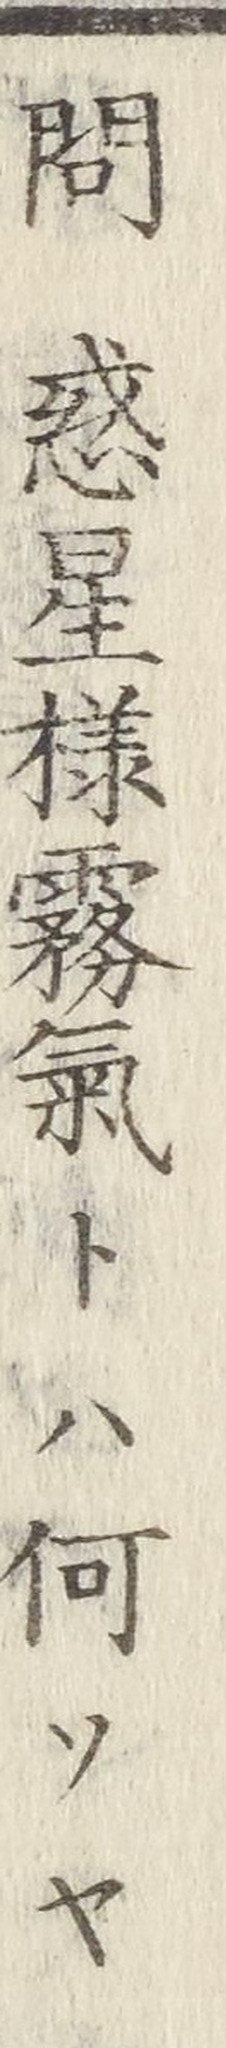問惑星様霧気トハ何ソヤ
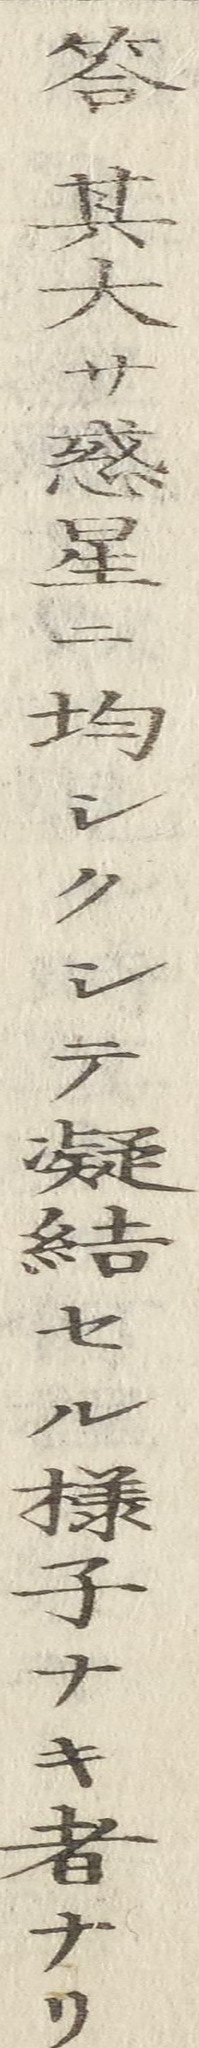答其大サ惑星ニ均シクシテ凝結セル様子ナキ者ナリ
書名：星学圖説　下
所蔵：東京大学地震研究所図書室 Earthquake Research Institute Library, The University of Tokyo, JAPAN
